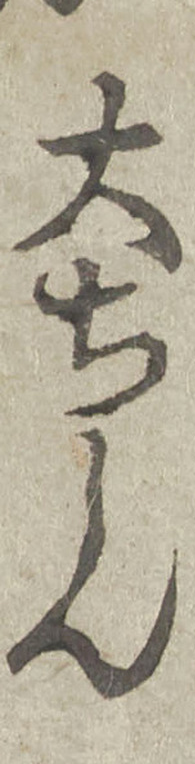大ちしん
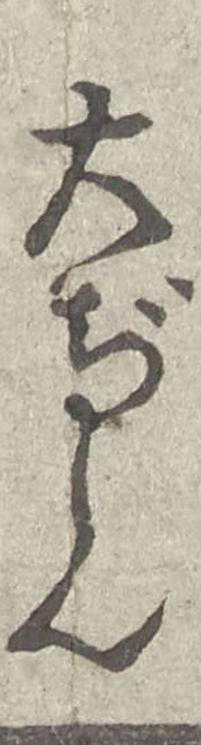大ぢしん
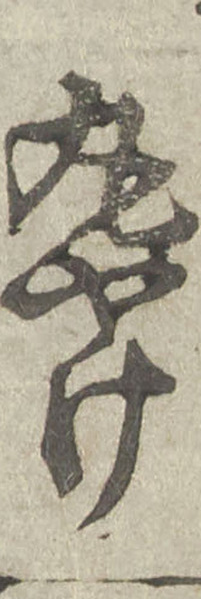丸やけ
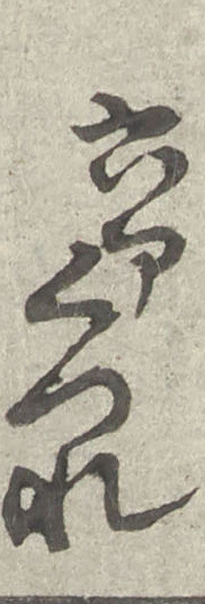くつれ
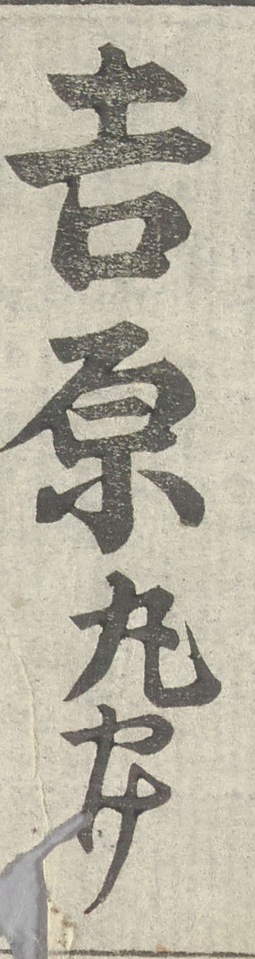吉原丸やけ
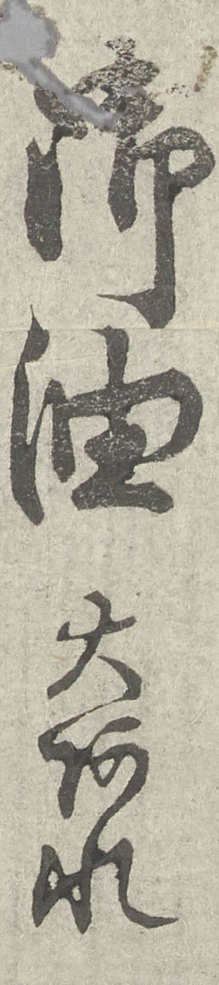御油大あれ
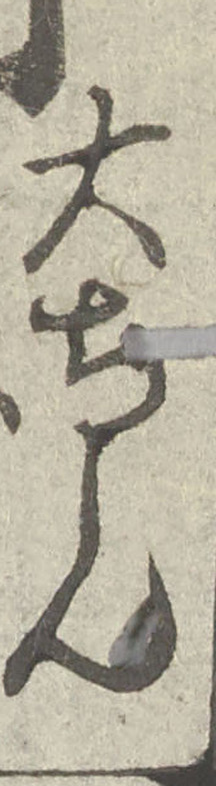大ちしん
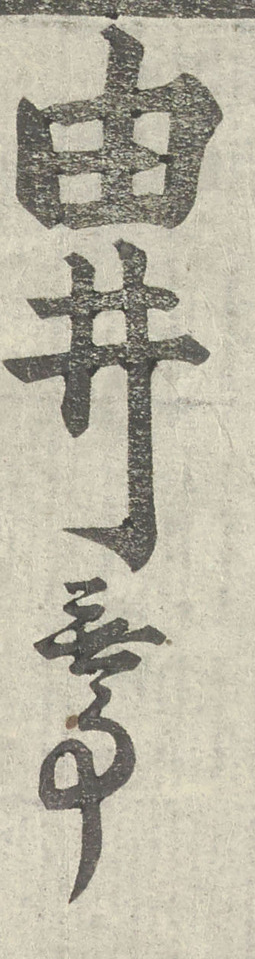由井無事
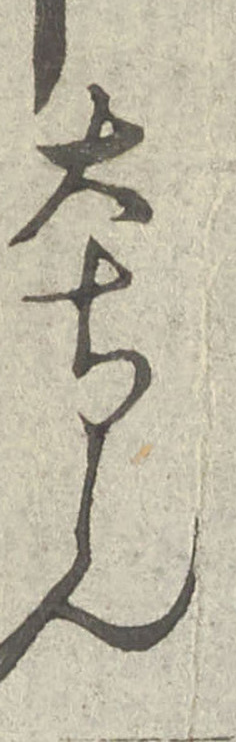大ちしん
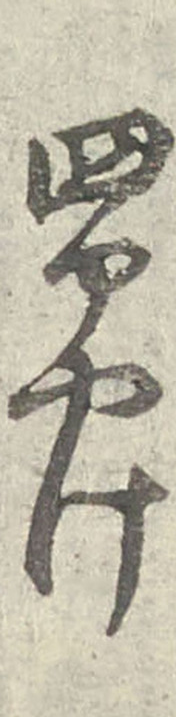四部やけ
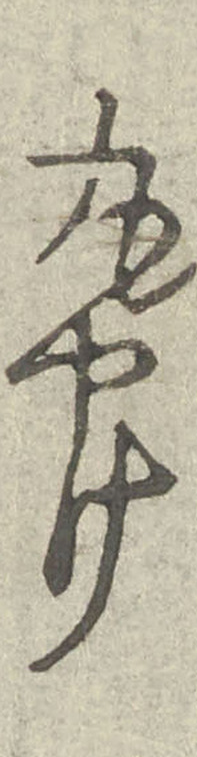丸やけ
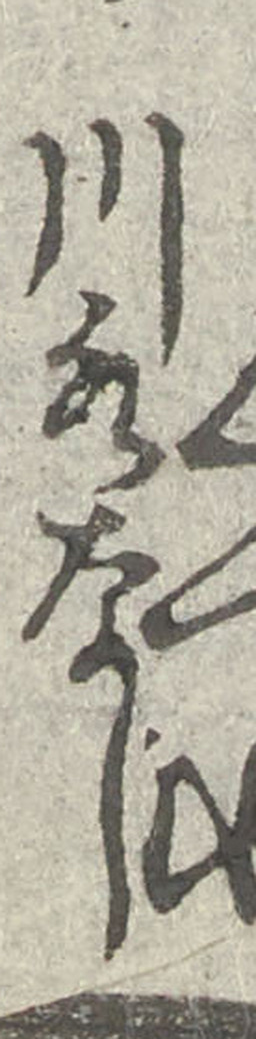川水なし
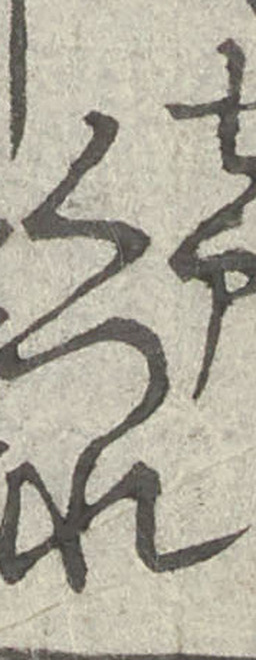くつれ
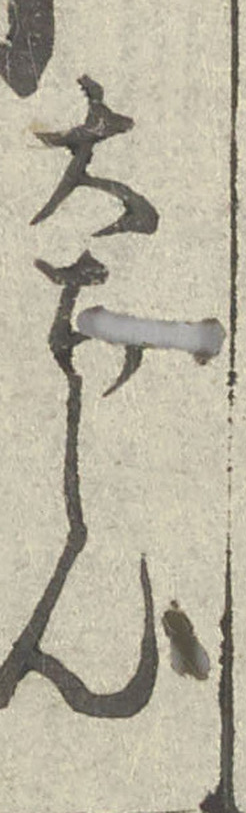大ちしん
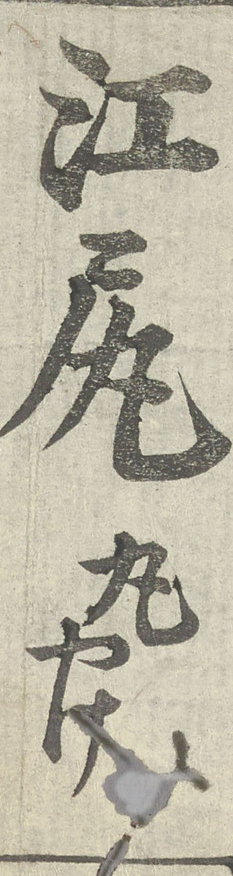江尻丸やけ
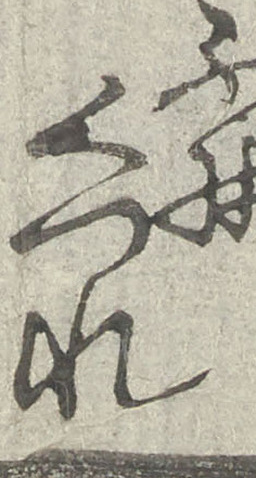くづれ
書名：東海道大地震津波出火
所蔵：東京大学総合図書館 General Library in the University of Tokyo, JAPAN
